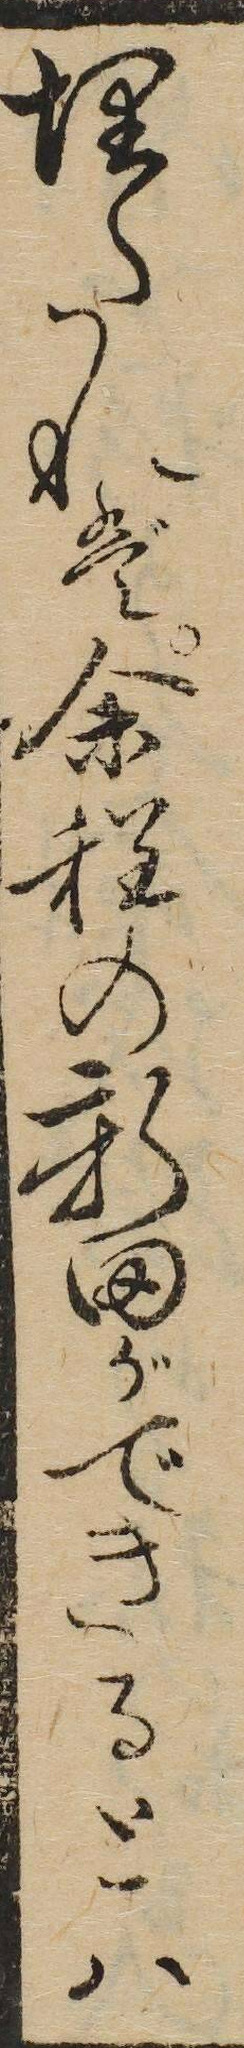埋たれば。余程の新田ができるとは
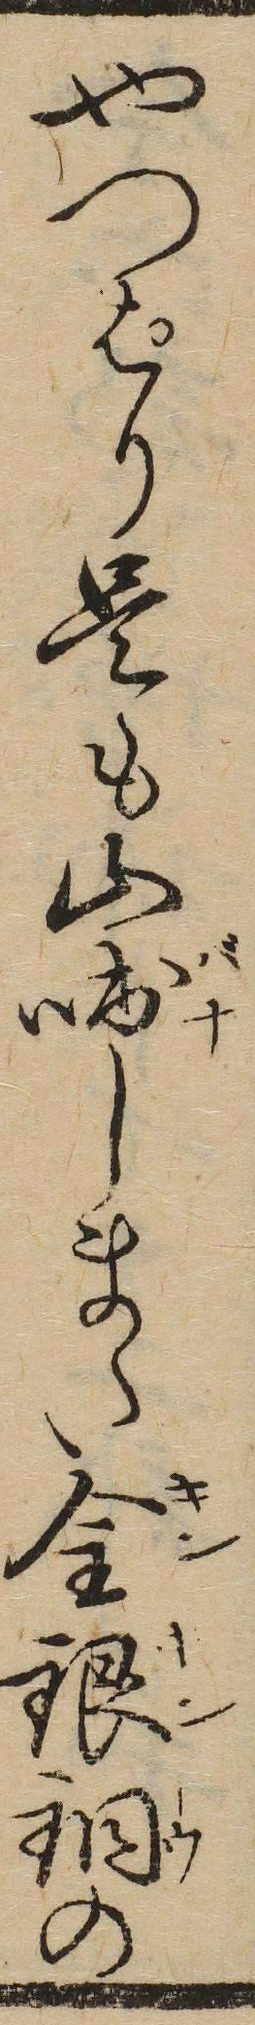やつぱり是も山咄しまた金銀銅の
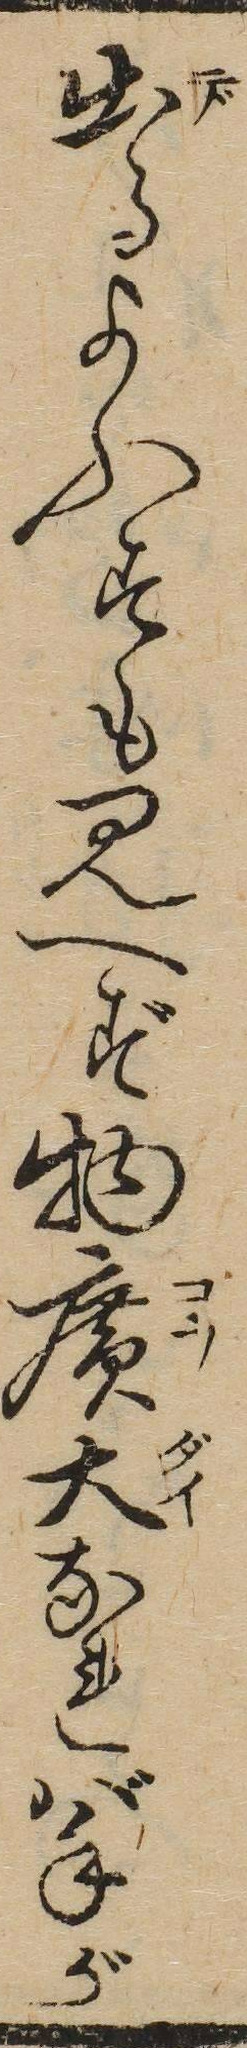出るよふすも見へず物広大なれば手が
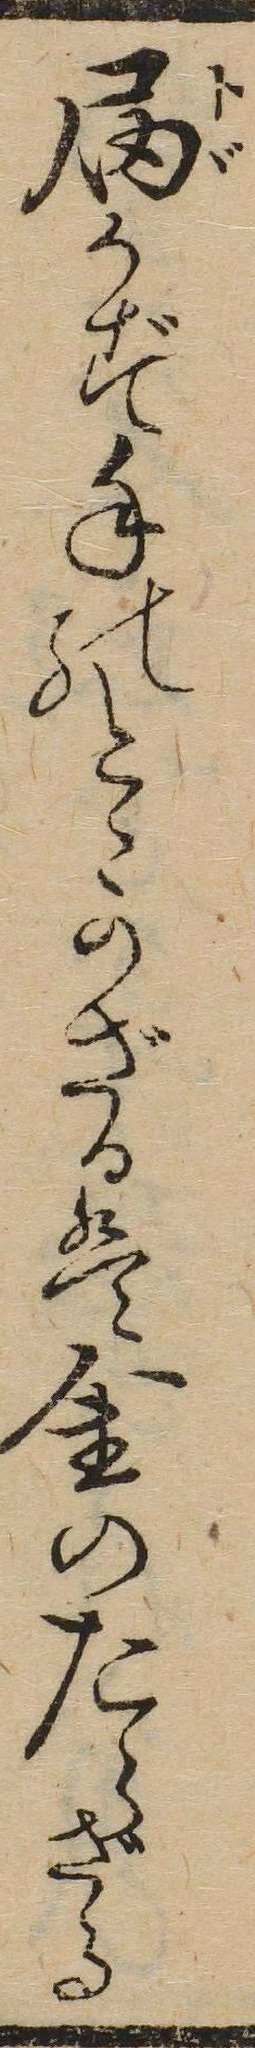届かず手のとゝかざるは金のたらざる
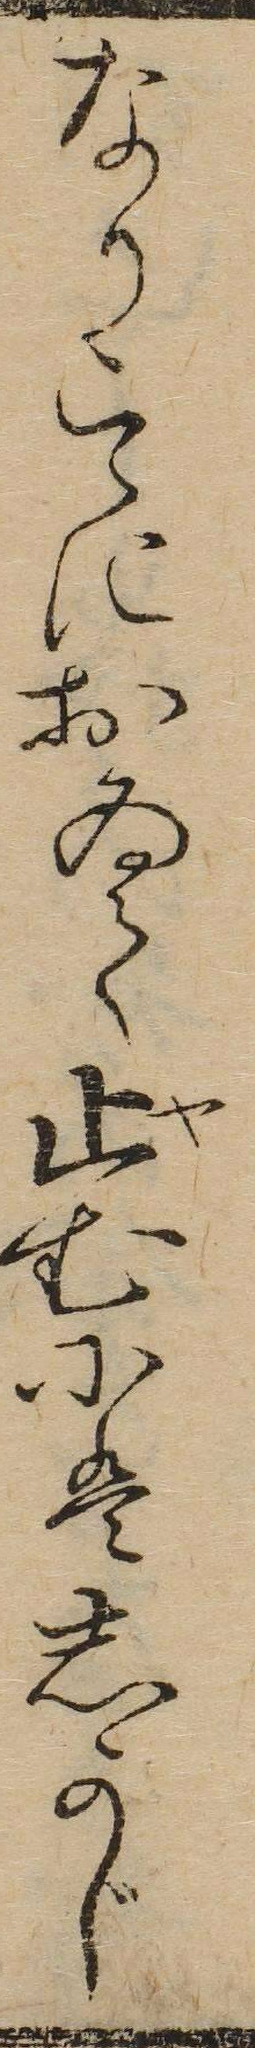なりこゝにおゐて止むにはしかじ
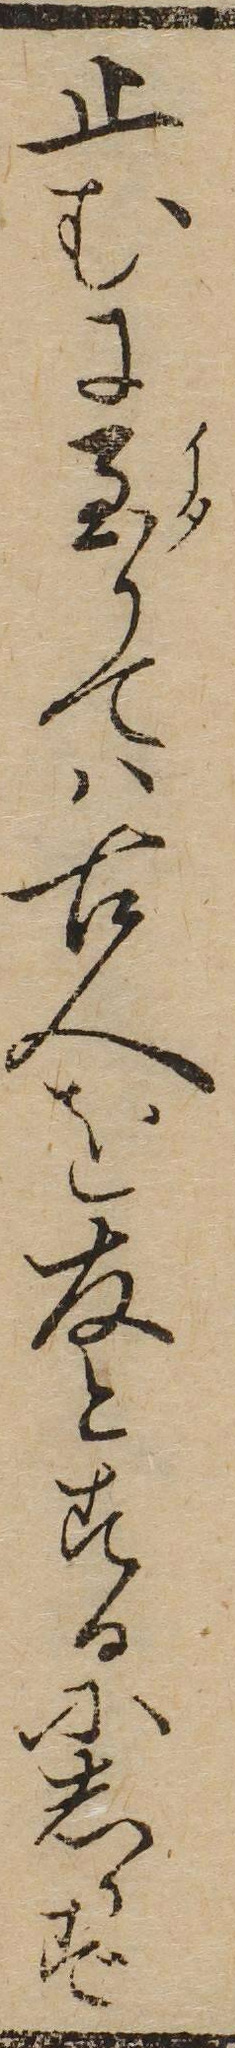止むに至りては古人を友とするにしかず
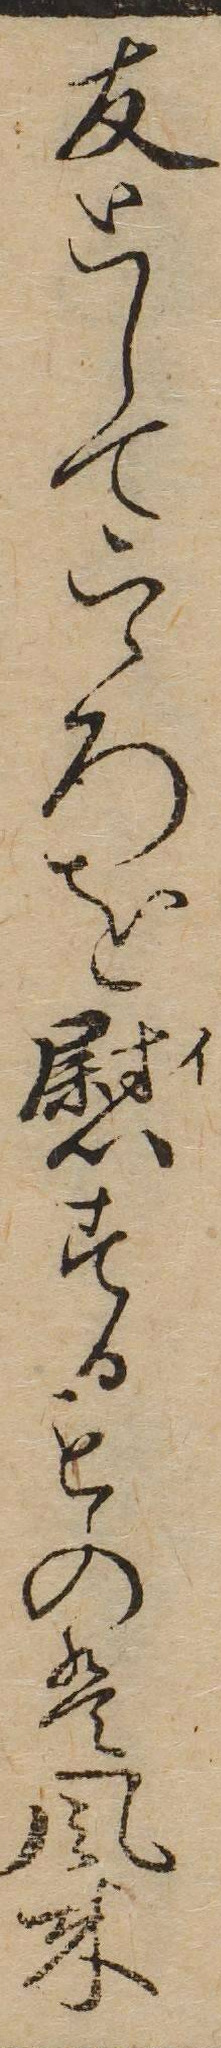友としてこゝろを慰するものは風来
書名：細見嗚呼御江戸
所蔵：国文学研究資料館
